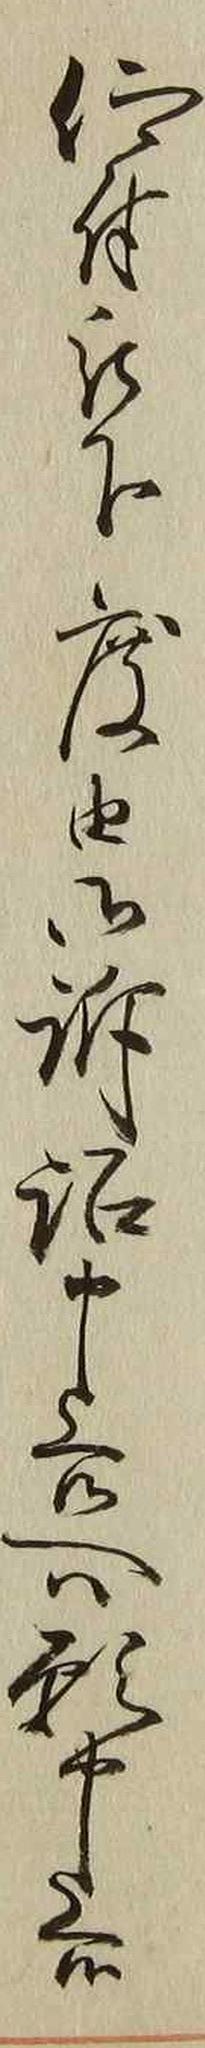仰付被下度由訴訟申上候へハ願申上候
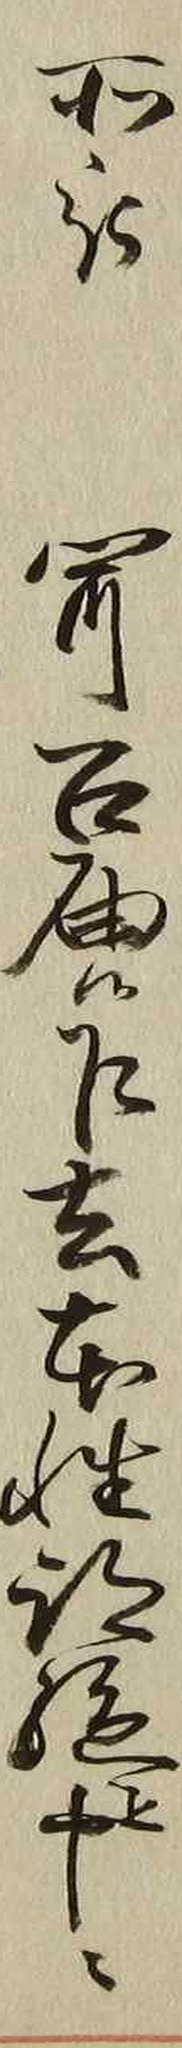所被聞召届候乍去本性跡絶被申ニ
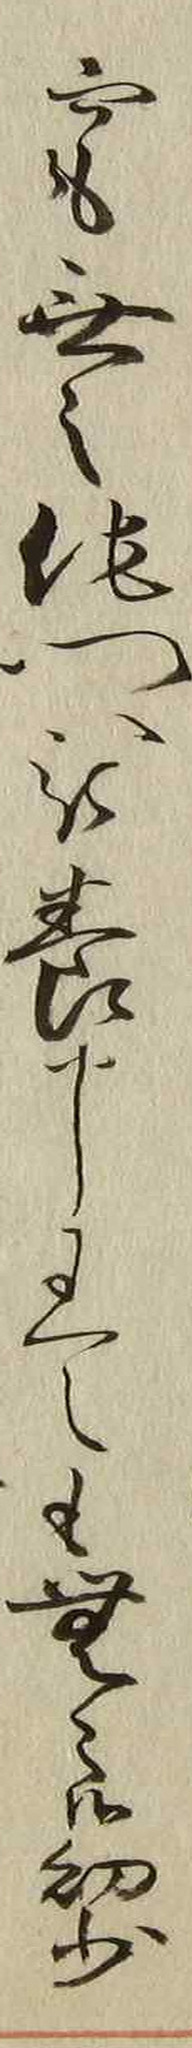而も無之他門へ被養申にても無々候幼少
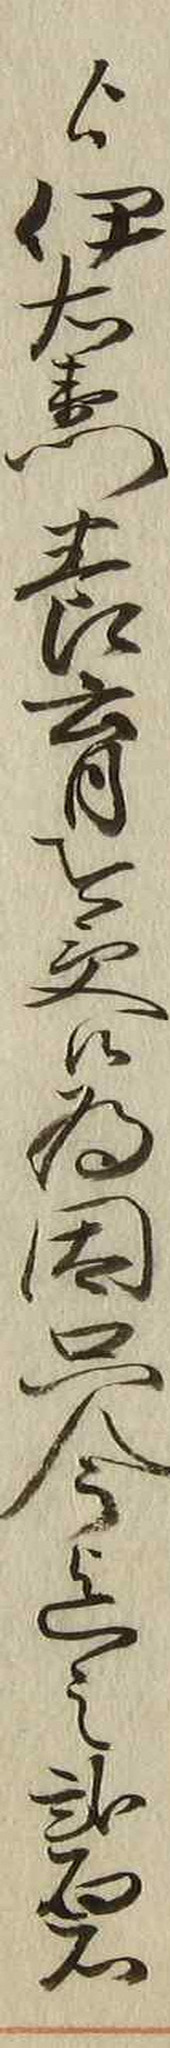ゟ伊右衛門養育を受候為因只今迄之弐百石
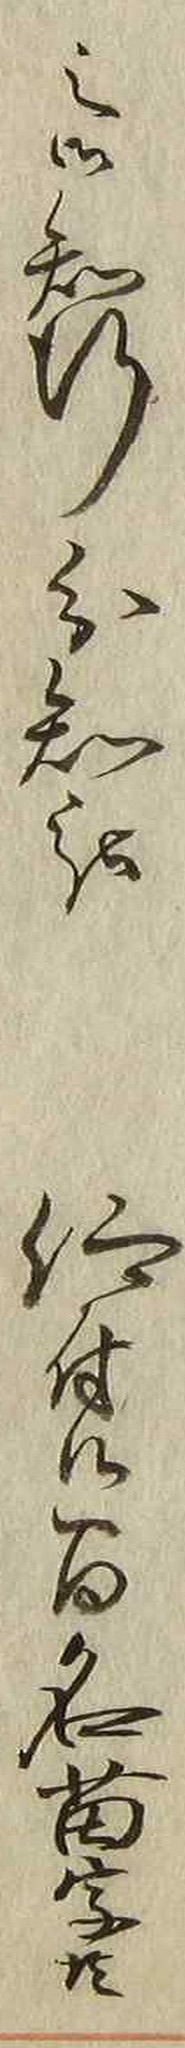之御知行分知被仰付候間名苗字共
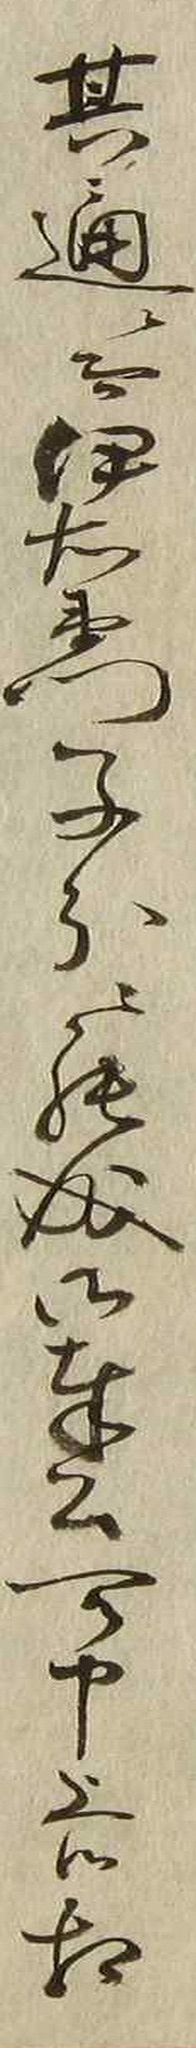其通ニ而伊右衛門子分ニ罷成御奉公可申上候相
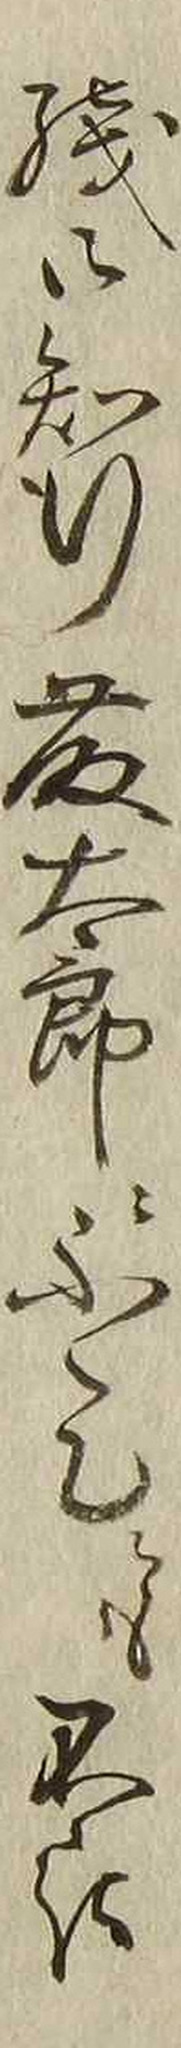残御知行藤太郎ニ不足ニも不被
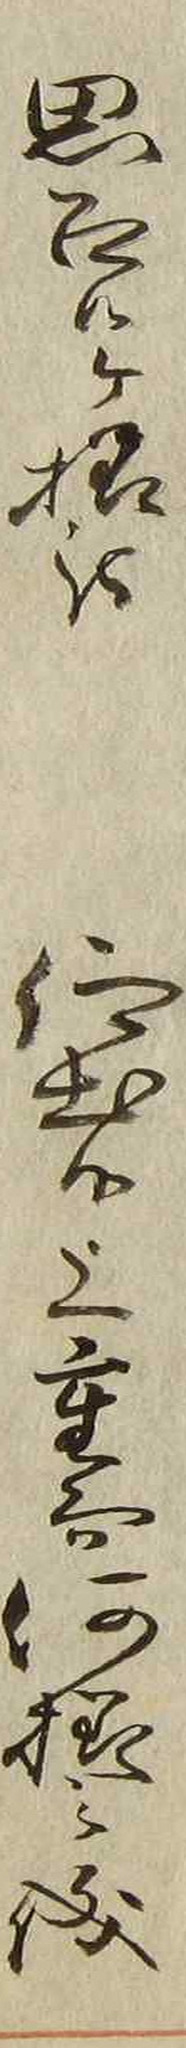思召候ヶ様被仰出候上重而何様之儀
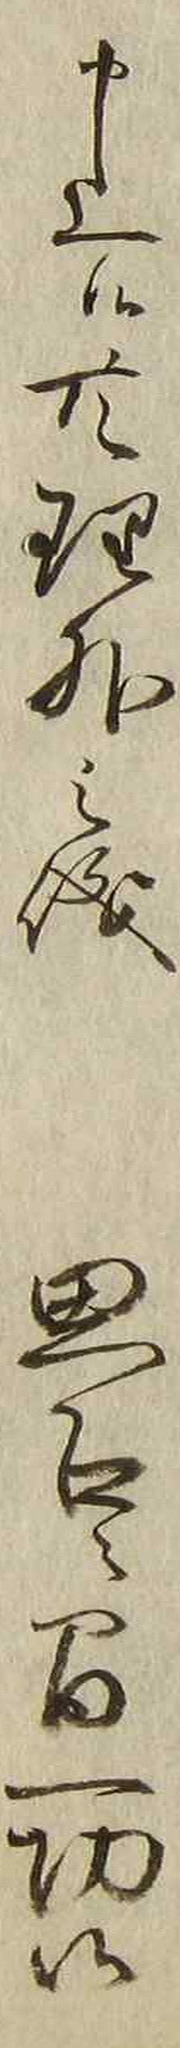申上候共理外之儀思召之間一切御
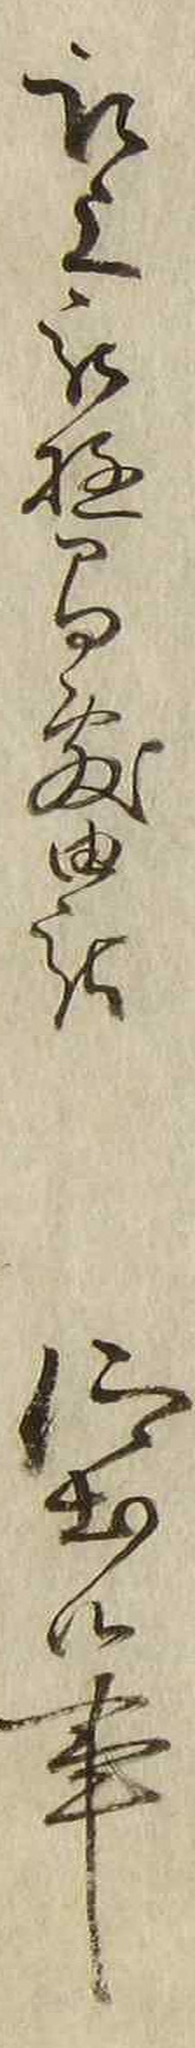取上被遊間敷由被仰出候事

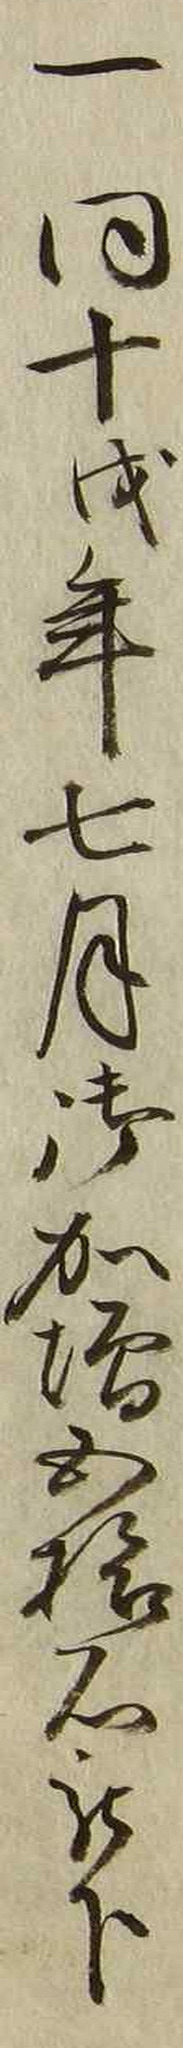一同十戌年七月御加増五拾石被下
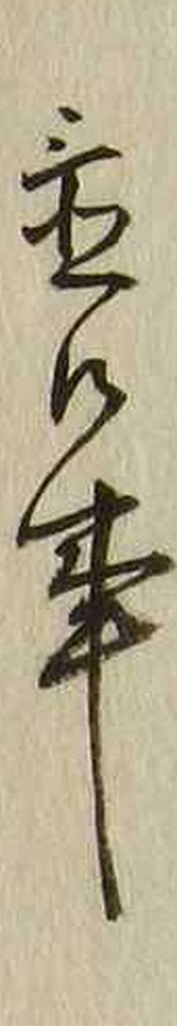置候事
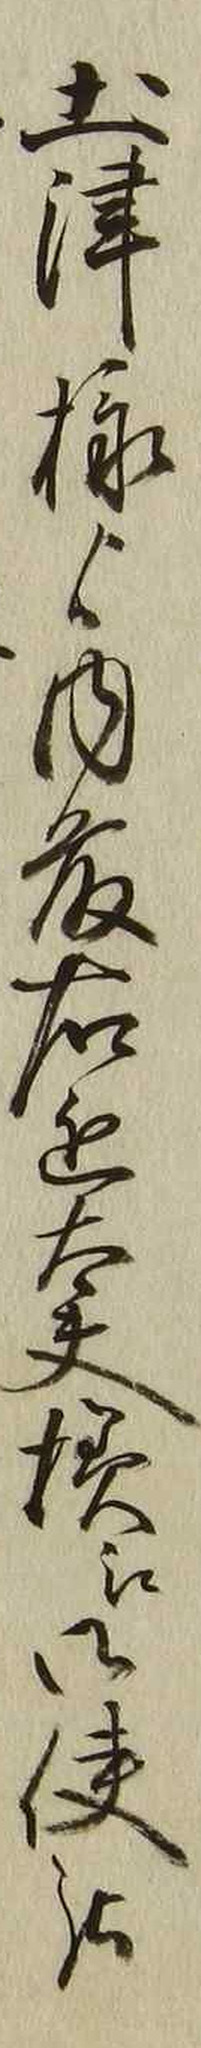土津様ゟ内藤右近太夫様江御使被
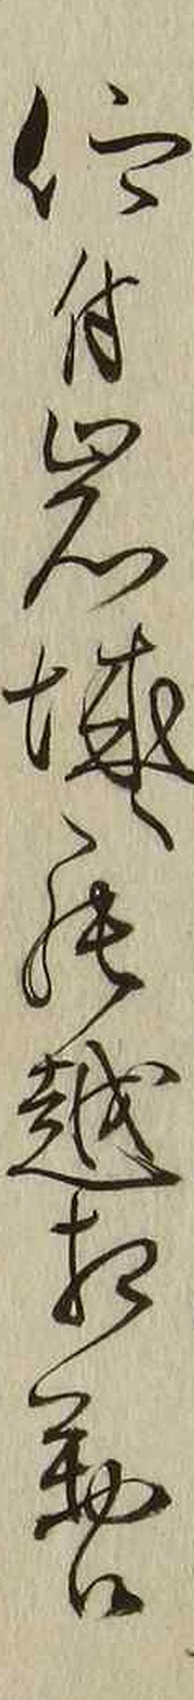仰付岩城へ罷越相勤候
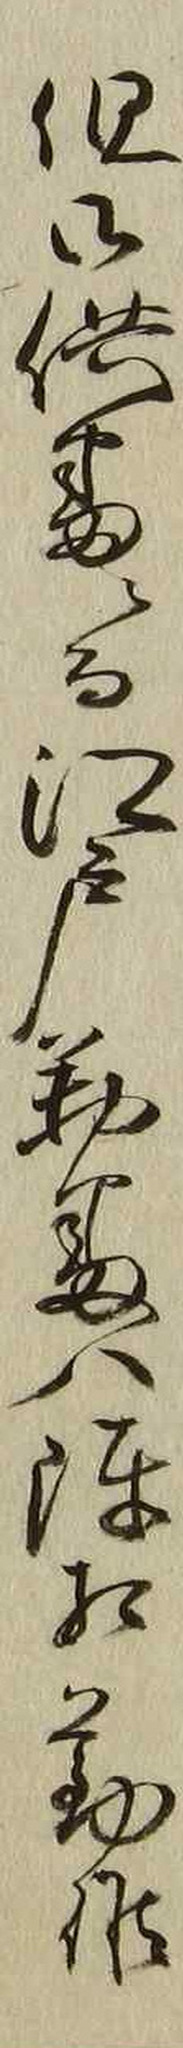但御供番ニ而江戸勤番八陣相勤候
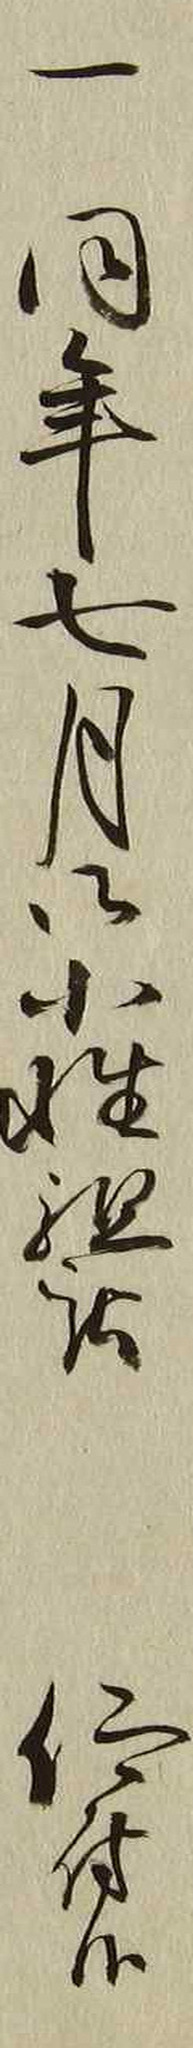一同年七月御小性組被仰付候
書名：諸士系譜　巻之60　と之部3
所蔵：会津若松市立会津図書館
